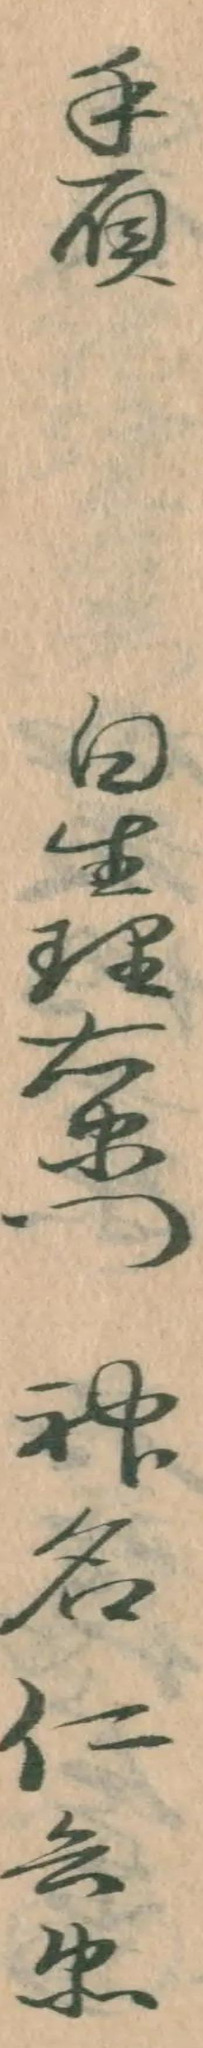手負白生理右衛門神名仁兵衛
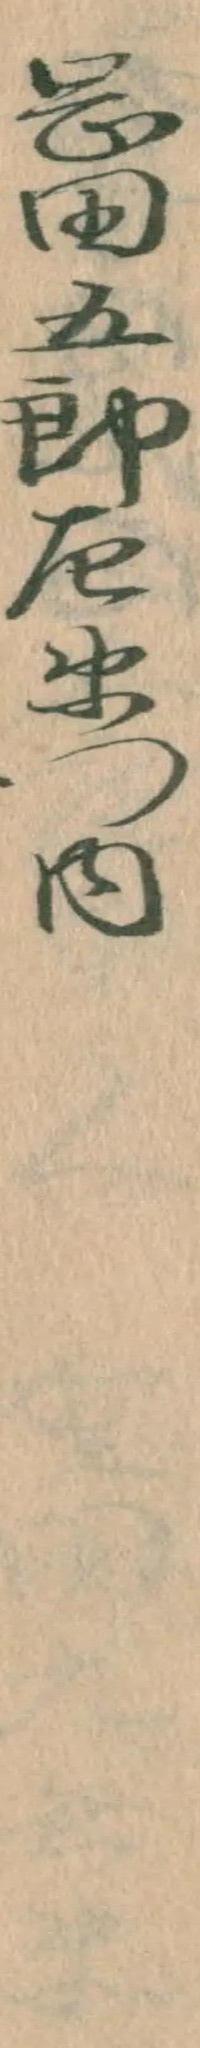岡田五郎左衛門内
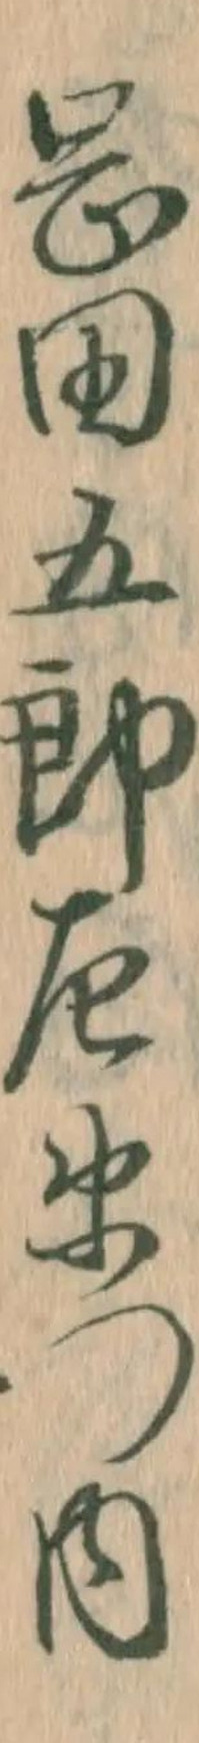岡田五郎左衛門内
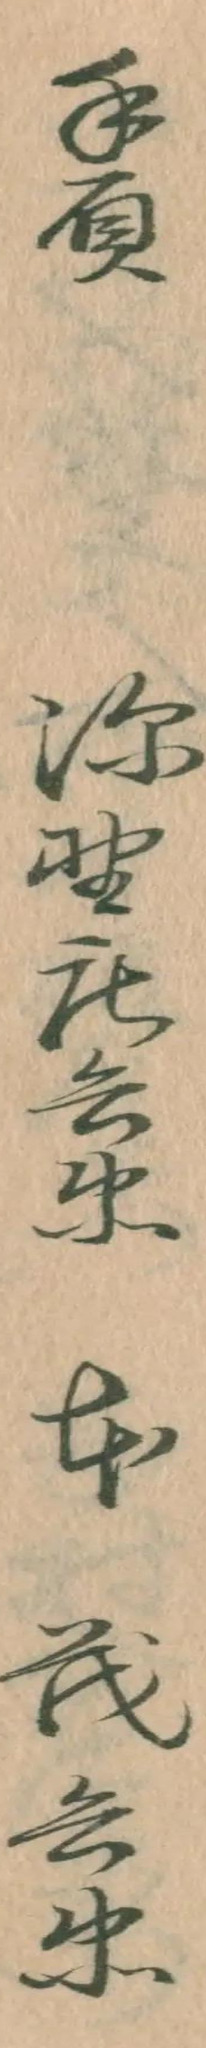手負沢野庄兵衛本茂兵衛
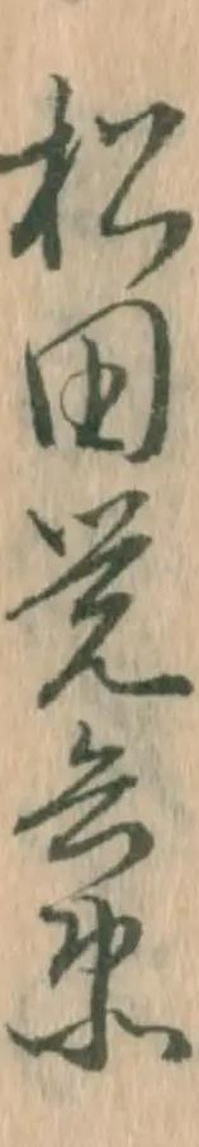松田覚兵衛
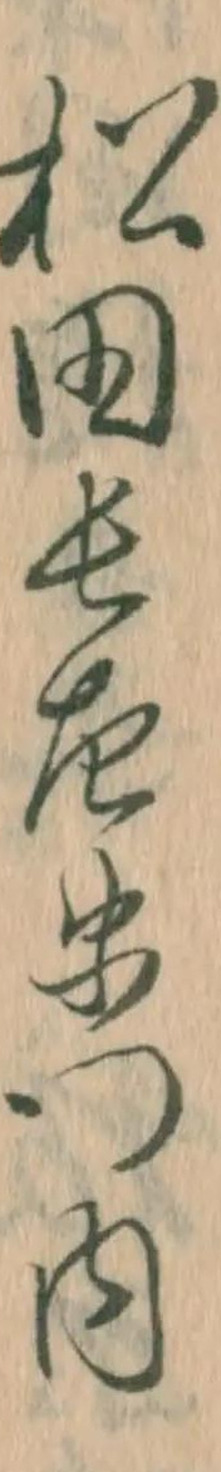松田長左衛門内
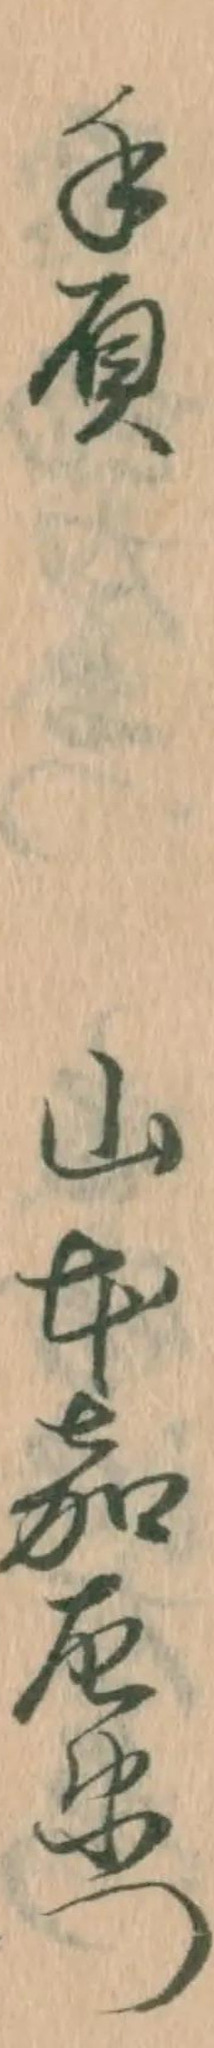手負山本嘉左衛門
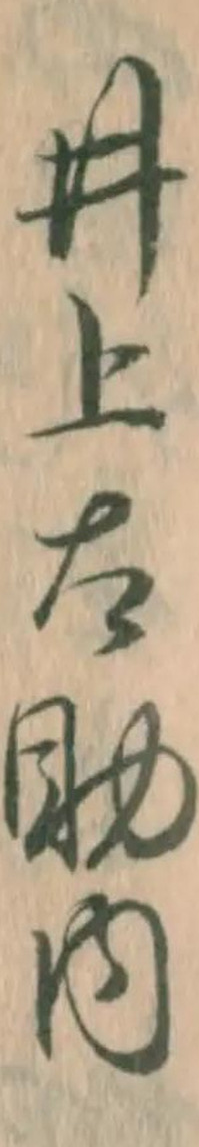井上太助内
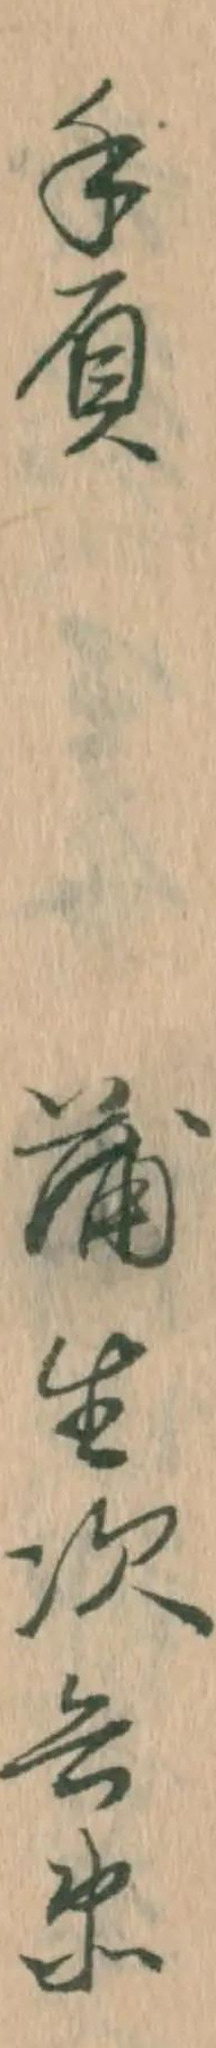手負蒲生勘右衛門
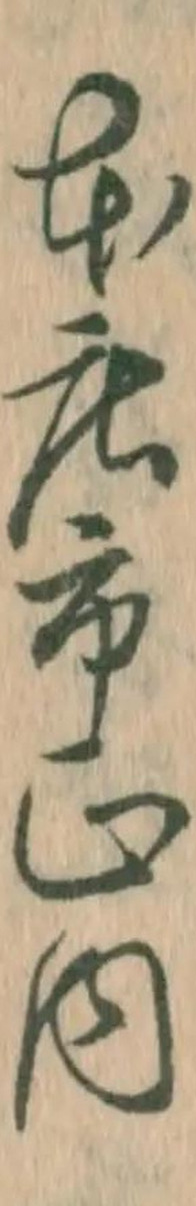本庄市正内
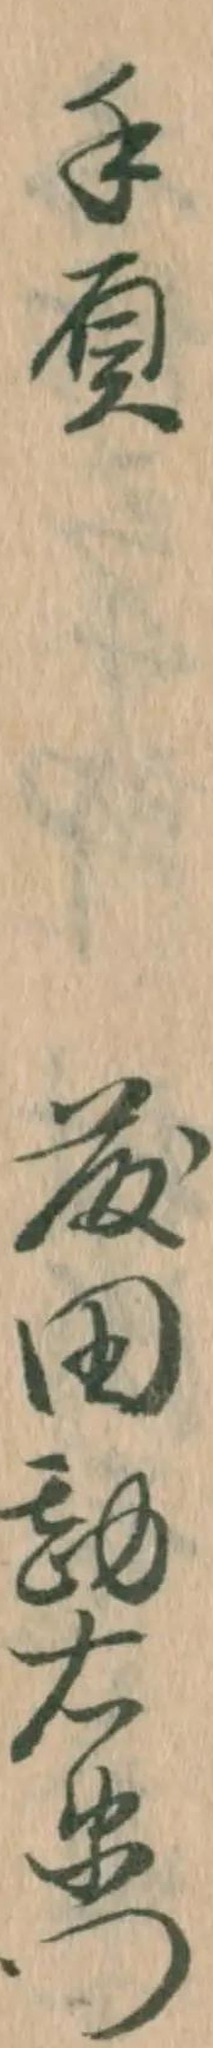手負藤田勘右衛門
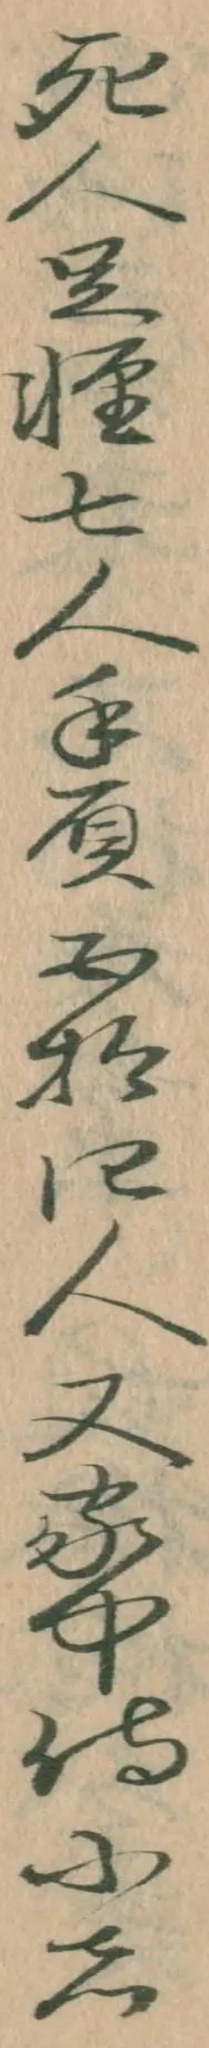死人足軽七人手負五拾四人又家中侍小者
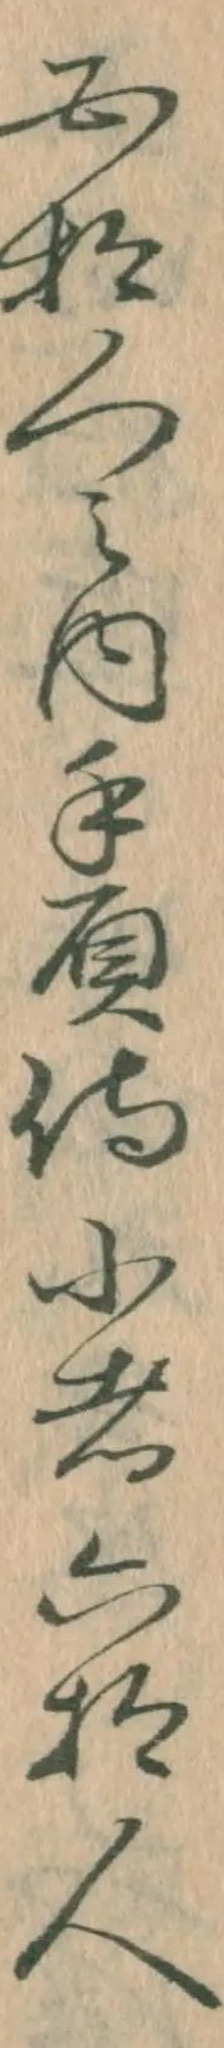五拾人之内手負侍小者六拾人
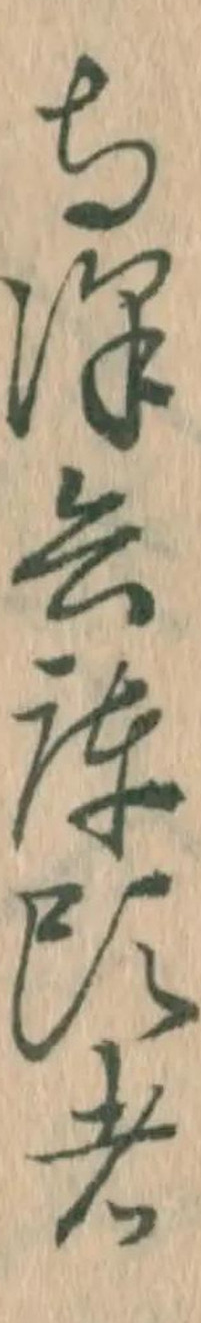寺沢兵諌頭者
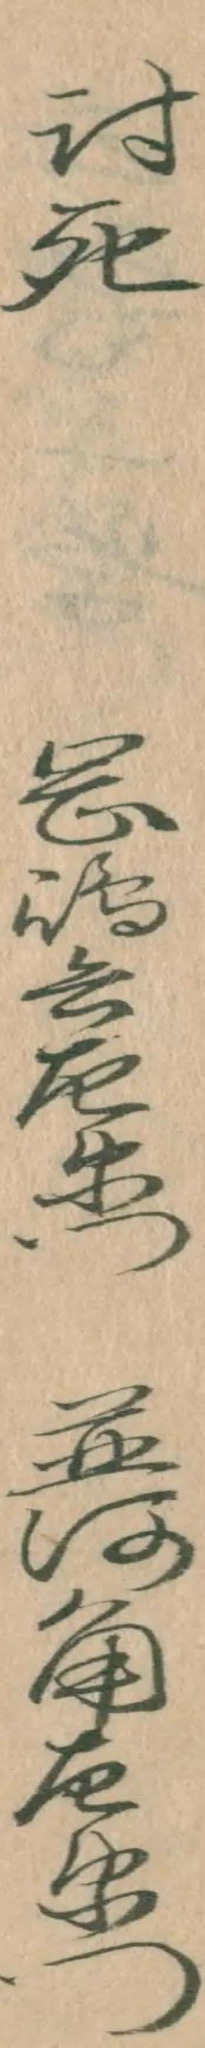討死岡島兵左衛門並河角左衛門
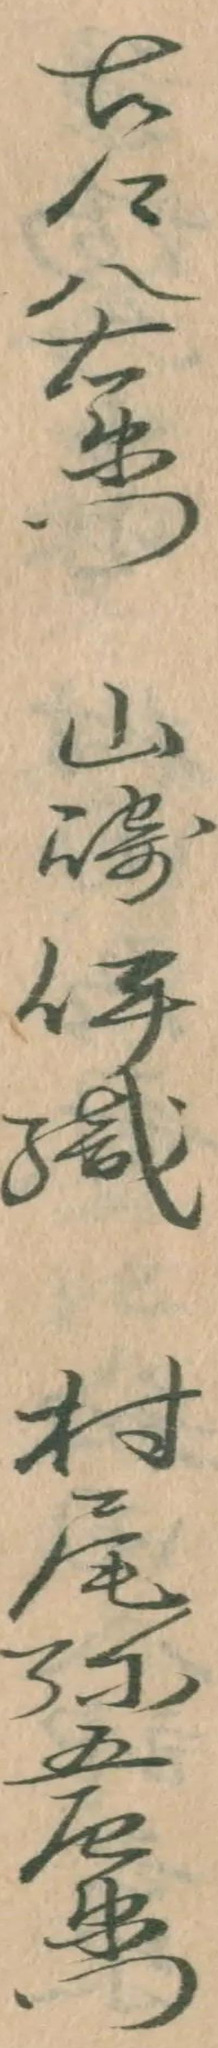古郷八右衛門山崎伊織村尾弥五左衛門
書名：切支丹御退治記 49巻. [9]
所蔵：国立国会図書館 National Diet Library, JAPAN
